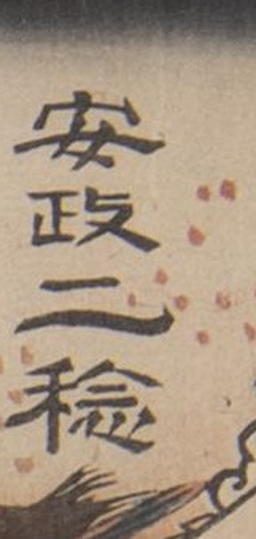安政二稔
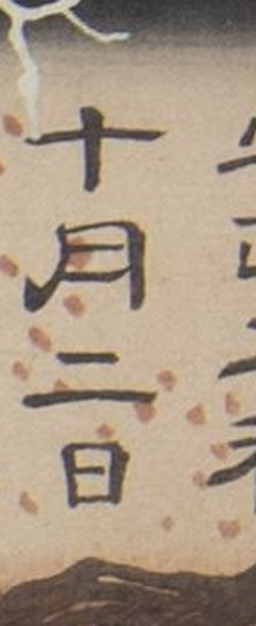十月二日
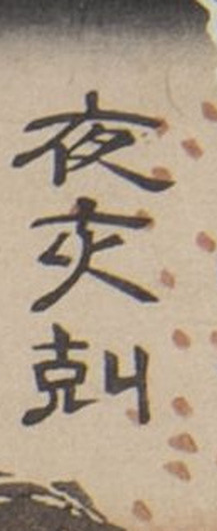夜亥剋
